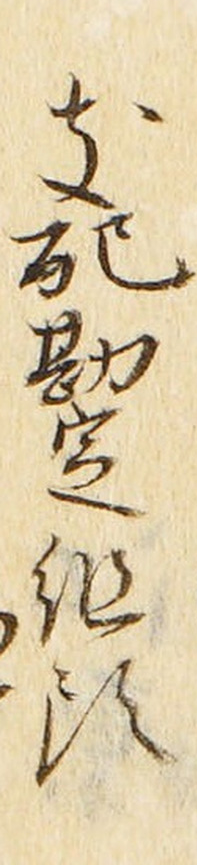支配勘定組頭
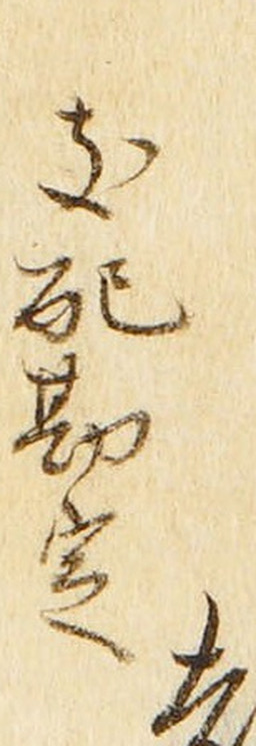支配勘定
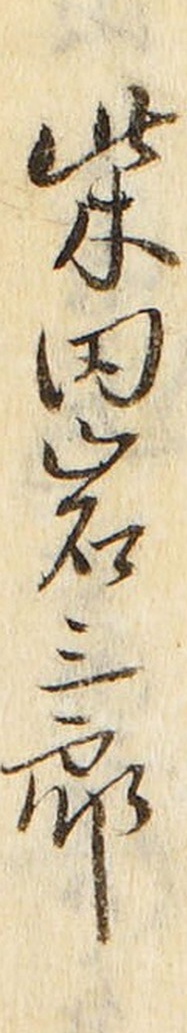柴田岩三郎
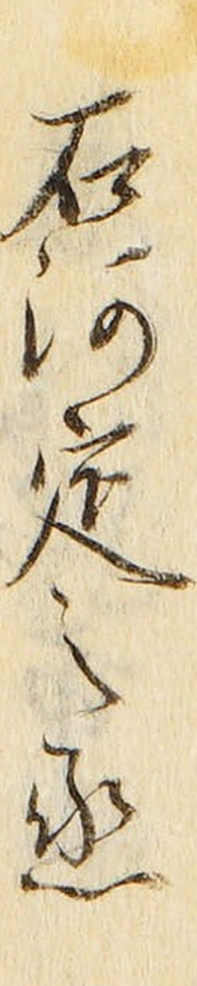石河定之丞
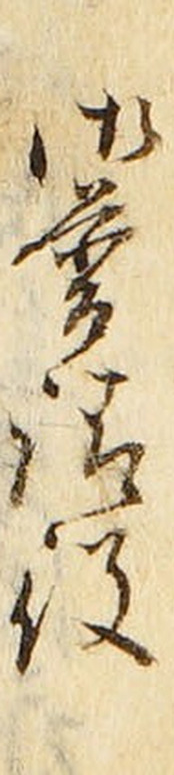御普請役
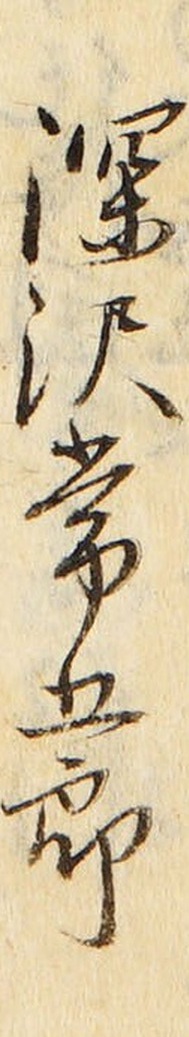深沢常五郎
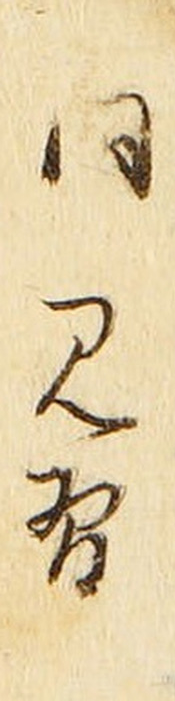同見習
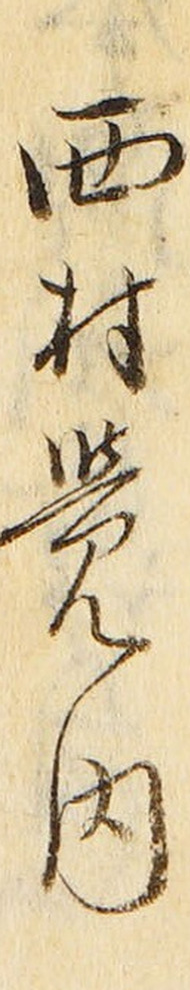西村覚内
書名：漂流人弥市之記
